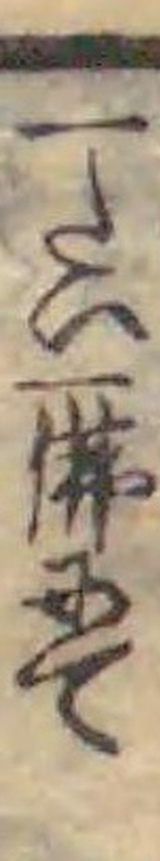一たい一仏にて
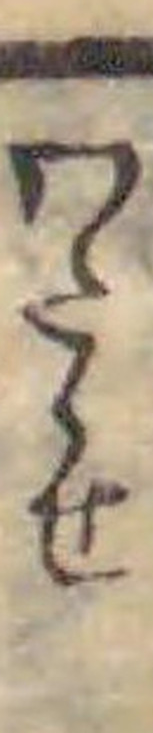わたらせ
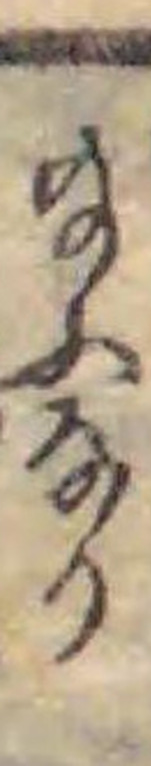給ふなり
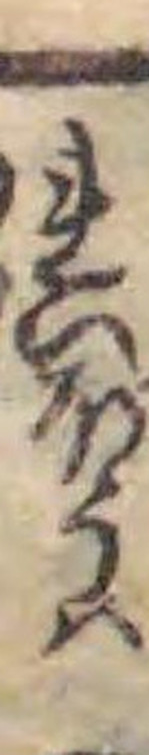れいほうは
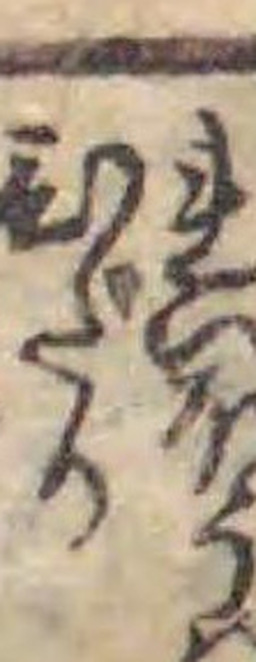ひだり
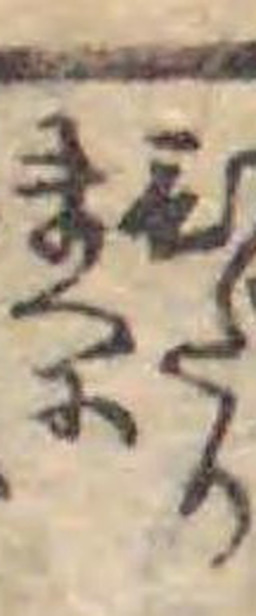まへに
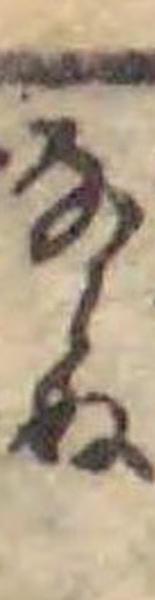ならぬ
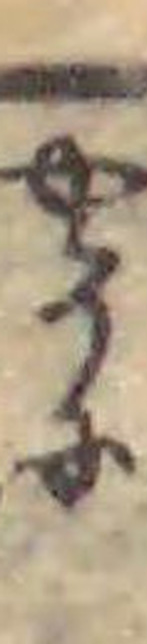やうに
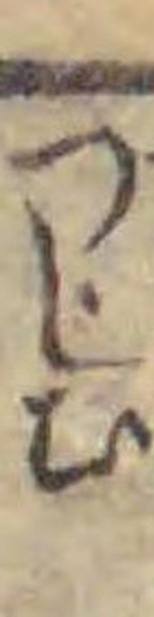つゝしむ
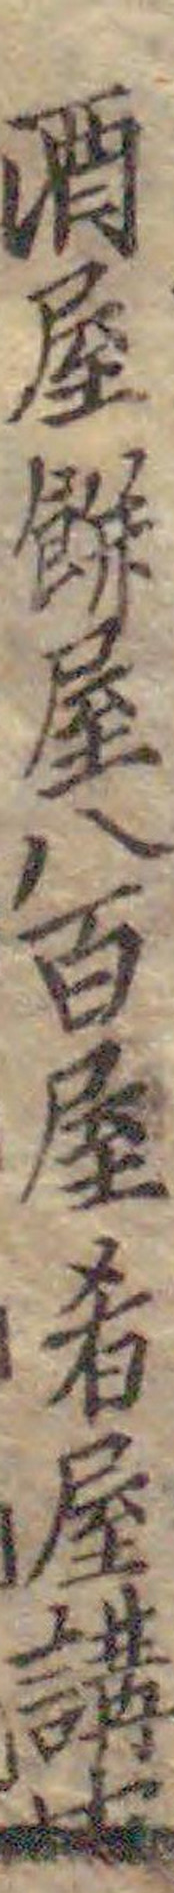酒屋餅屋八百屋肴屋講中

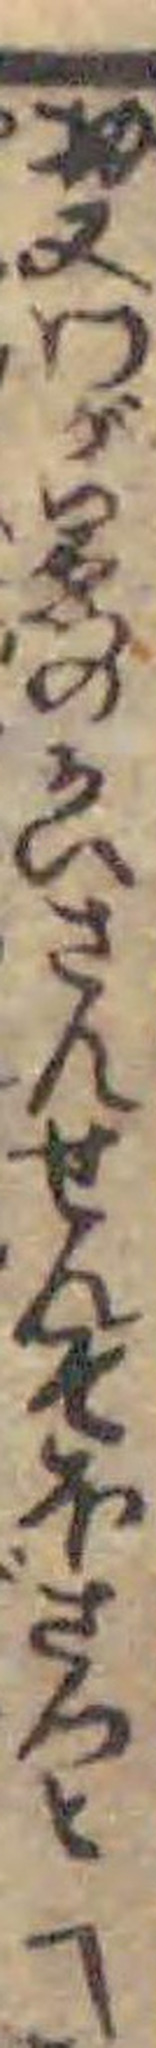扨又わがいゑのかいさんせんそほさつと
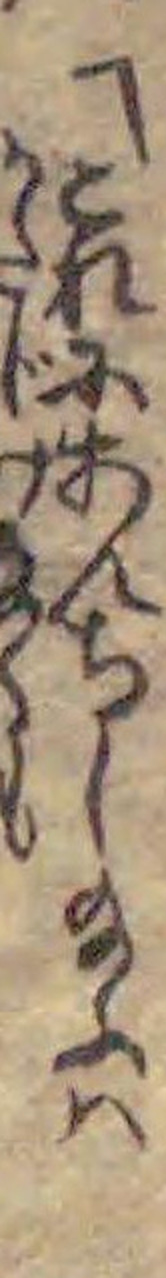〽これにあんちし給ふは
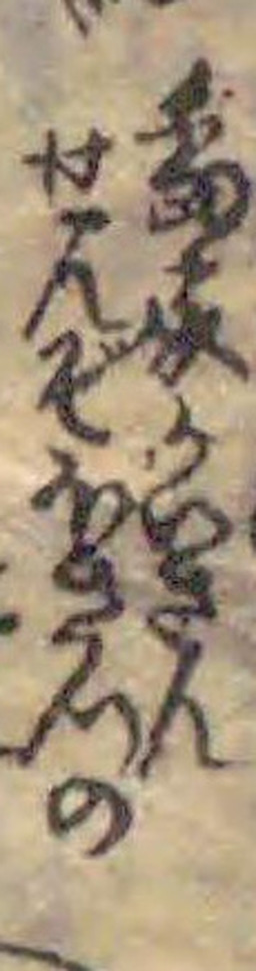せんぞほさつの
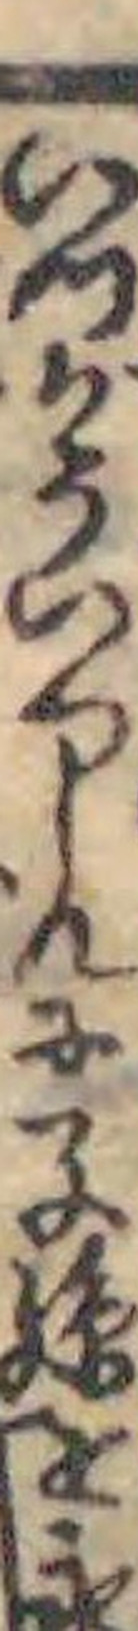いつかういつしんに子孫を永く
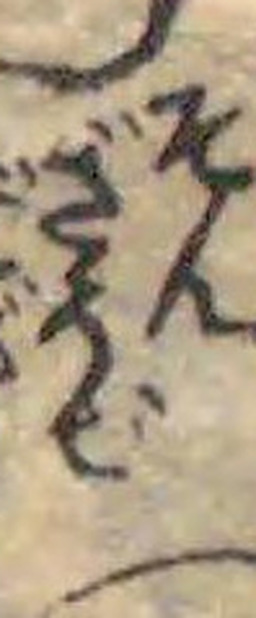ざうで
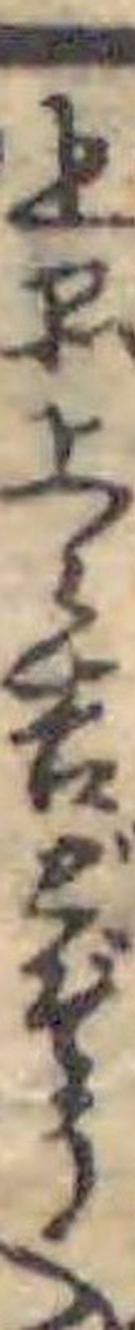上品上々吉どぞう
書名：身体開帳略縁起 : 3巻
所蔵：国立国会図書館 National Diet Library, JAPAN
